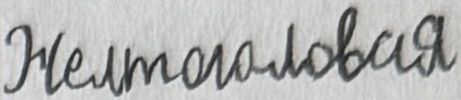желтоголовая
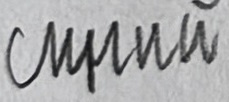синий
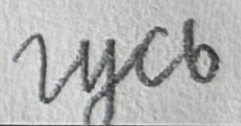гусь
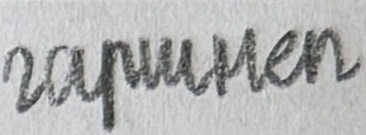гаршнеп
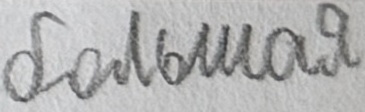большая
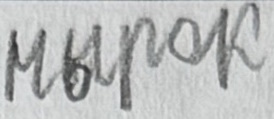нырок
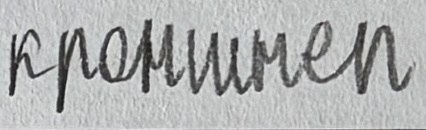кроншнеп
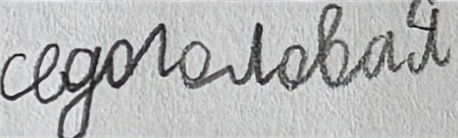седоголовая
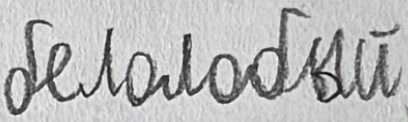белолобый
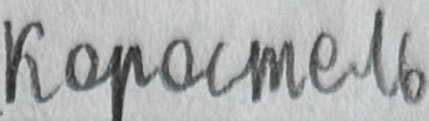коростель
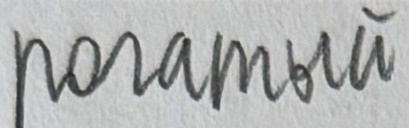рогатый
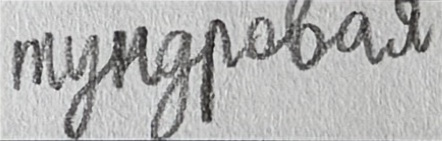тундровая
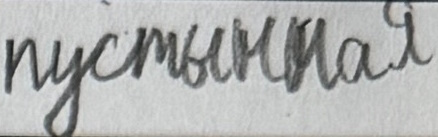пустынная
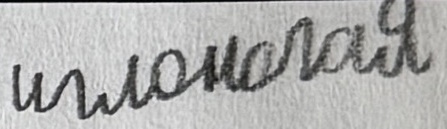иглоногая
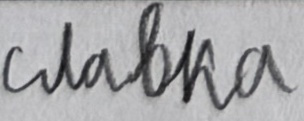славка
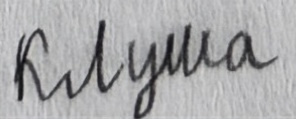клуша
